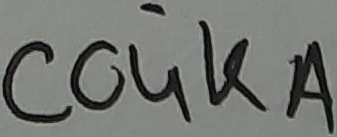сойка
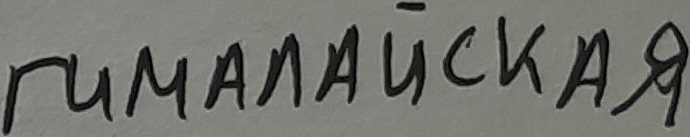гималайская
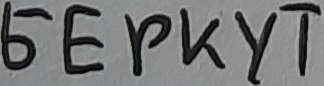беркут
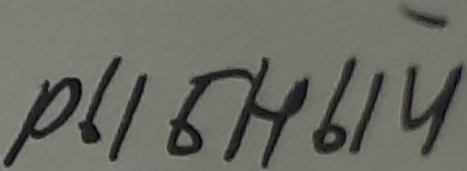рыбный
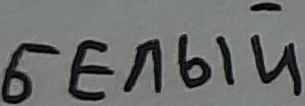белый
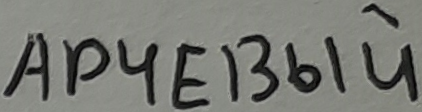арчевый
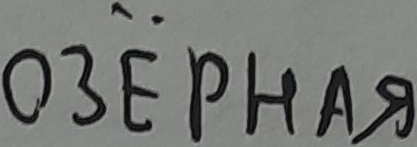озёрная
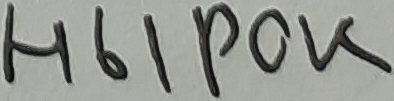нырок
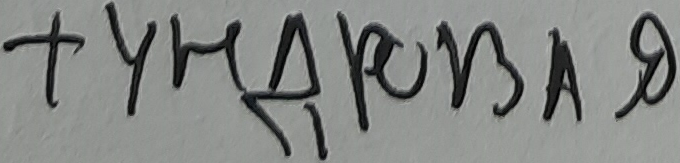тундровая
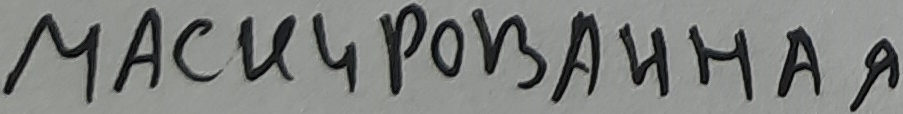маскированная
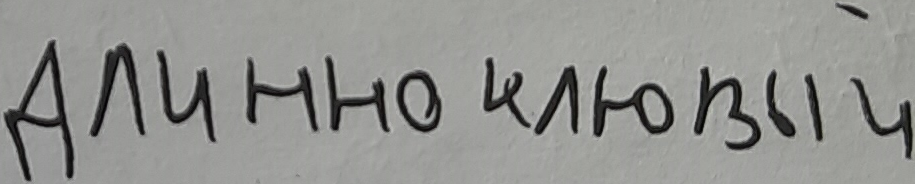длинноклювый
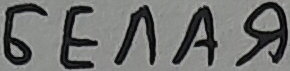белая
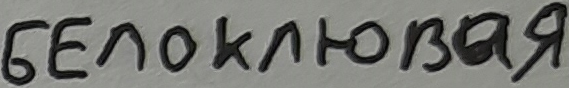белоклювая
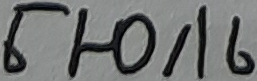бюль
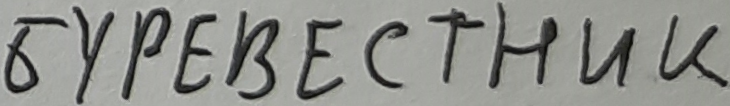буревестник
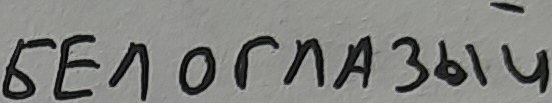белоглазый
